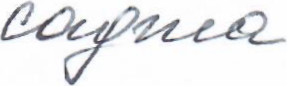саджа
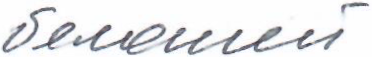белошей
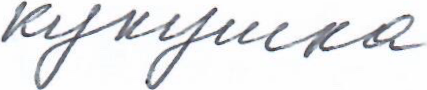кукушка
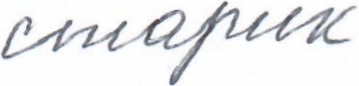старик
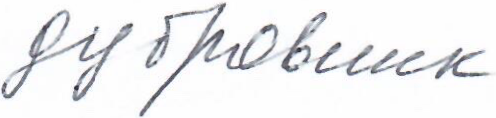дубровник
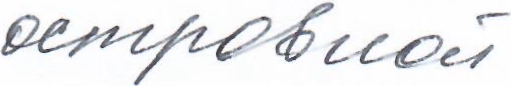островной
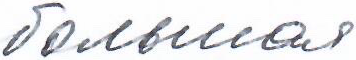большая
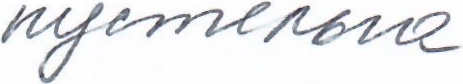пустельга
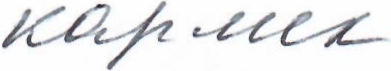карлик
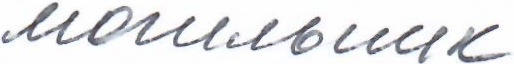могильник
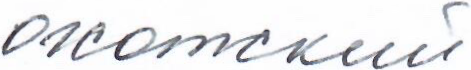охотский
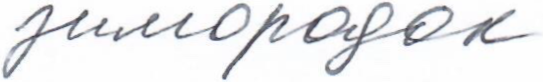зимородок
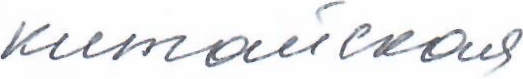китайская
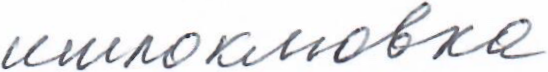шилоклювка
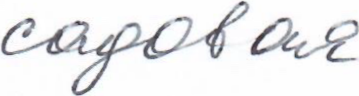садовая
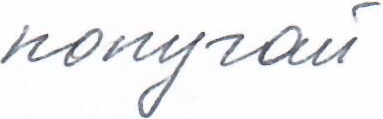попугай
